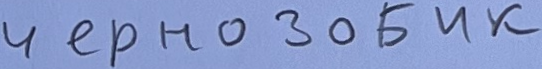чернозобик
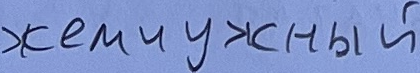жемчужный
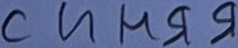синяя
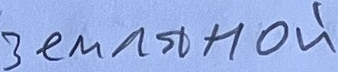земляной
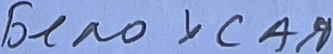белоусая
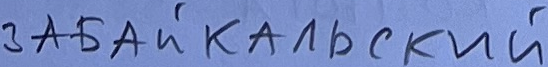забайкальский
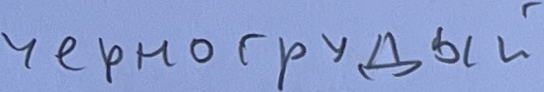черногрудый
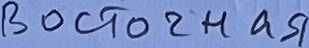восточная
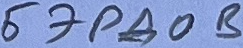бэрдов
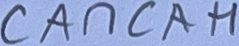сапсан
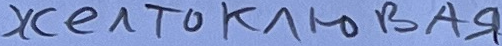желтоклювая
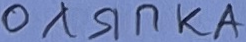оляпка
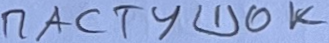пастушок
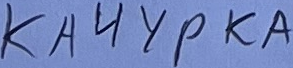качурка
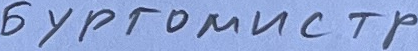бургомистр
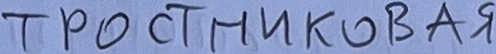тростниковая
